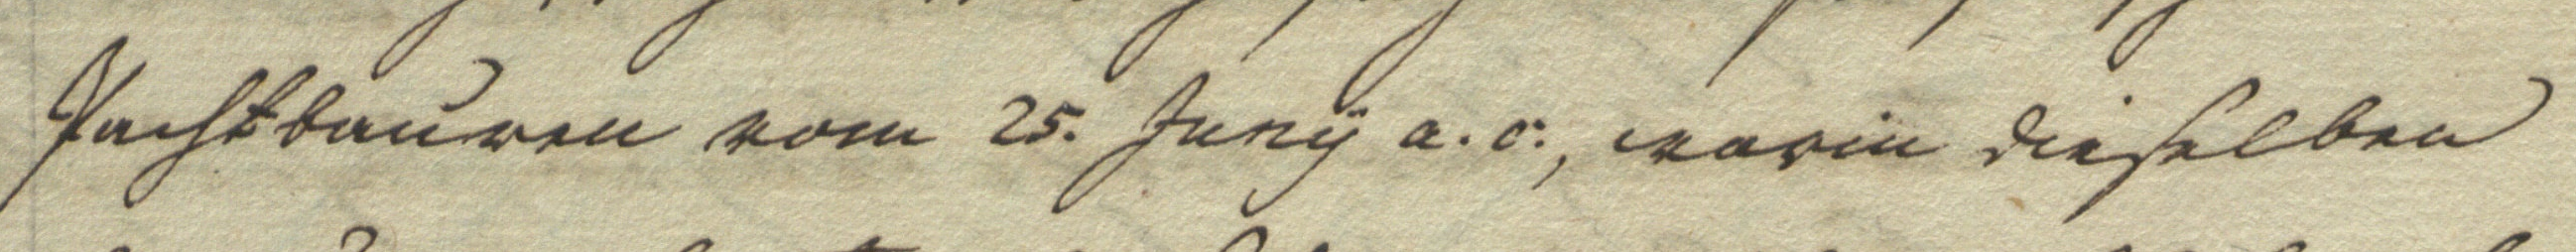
Pachtbauren vom 25. Junÿ a. c., worin dieselben
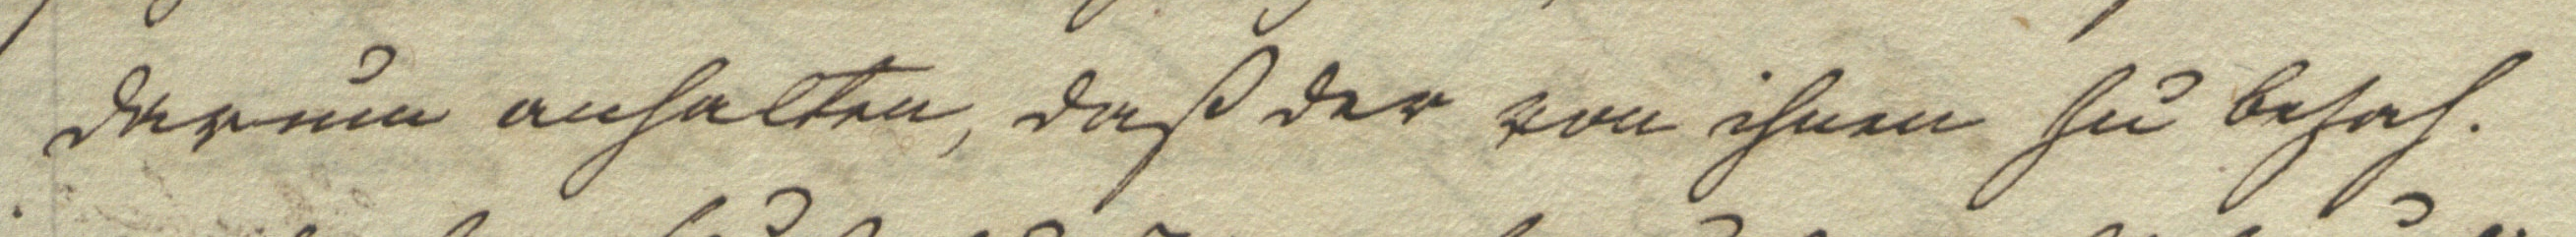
darum anhalten, daß der von ihnen zu bezah¬
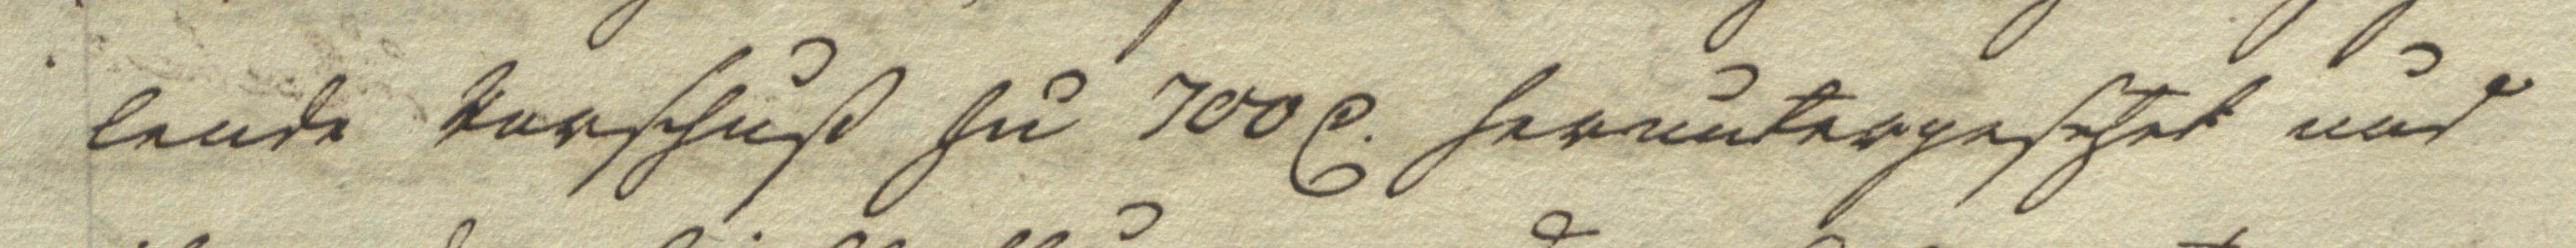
lendene Vorschuß zu 700 l. heruntergesetzet und
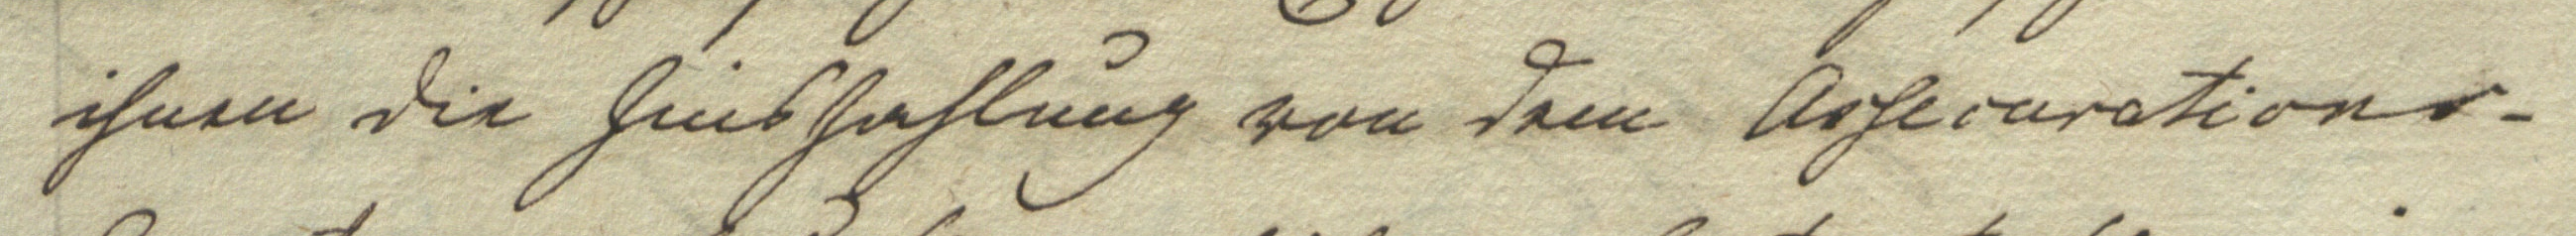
ihnen die Zinszahlung von dem Assecurations¬
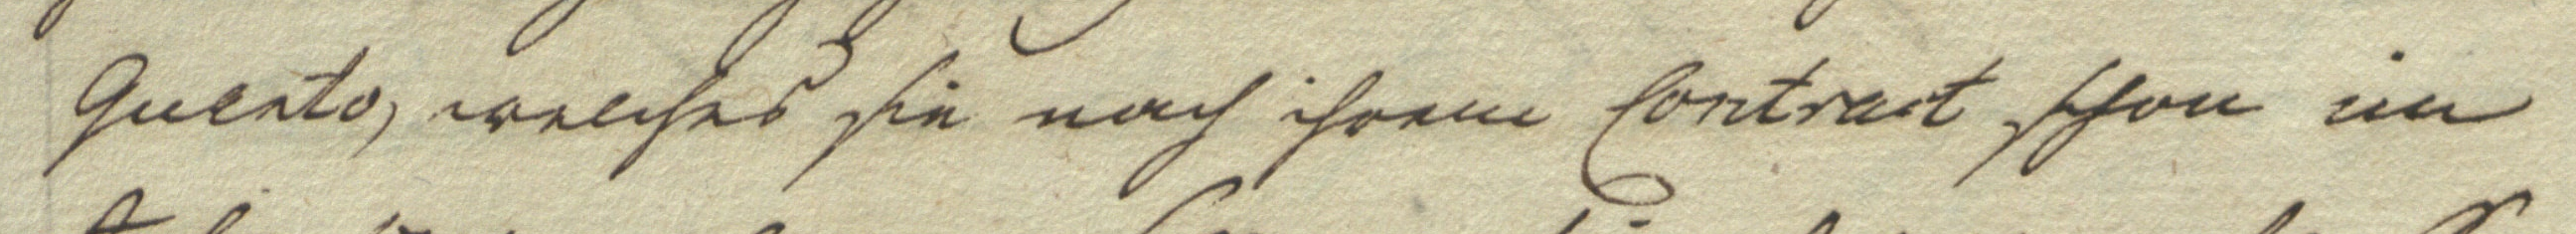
Quanto, welches sie nach ihrem Contract schon im
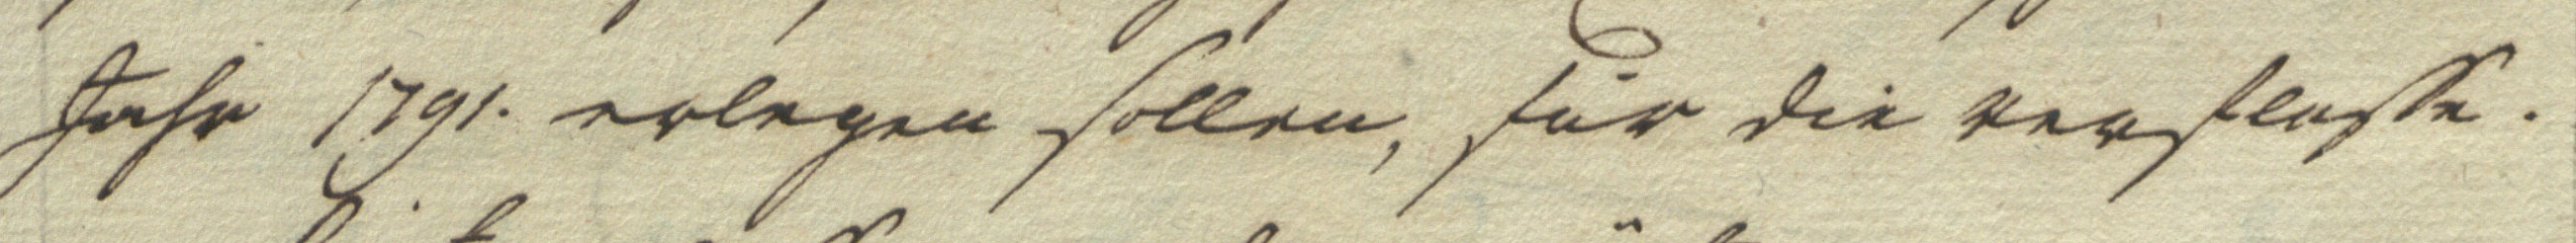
Jahr 1791. erlegen sollen, für die verflosse¬
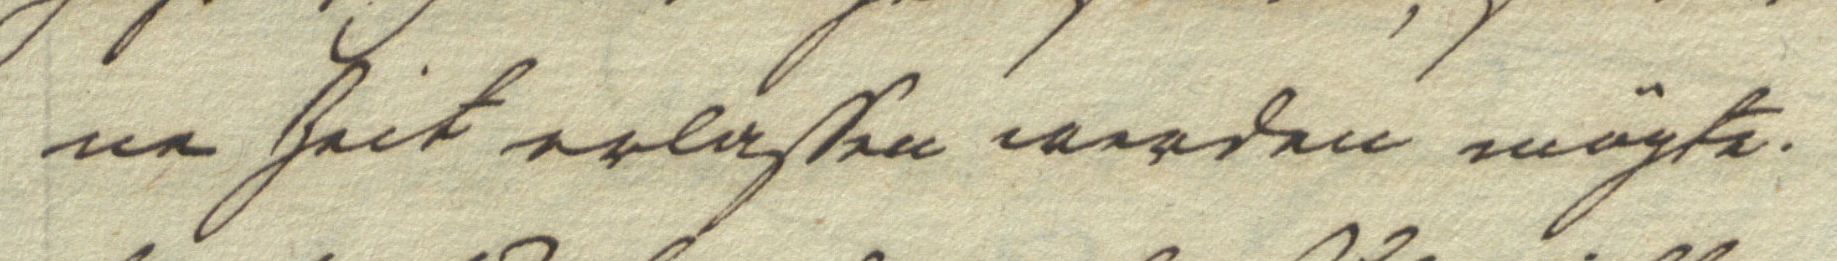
ne Zeit erlassen werden mögte.
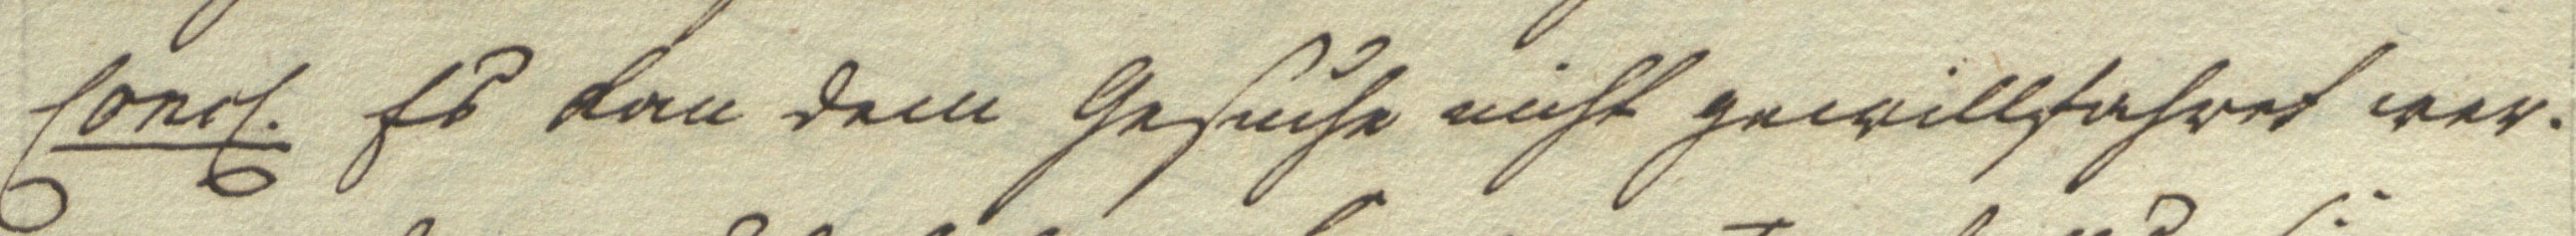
Concl. Es kan dem Gesuche nicht gewillfahret wer¬
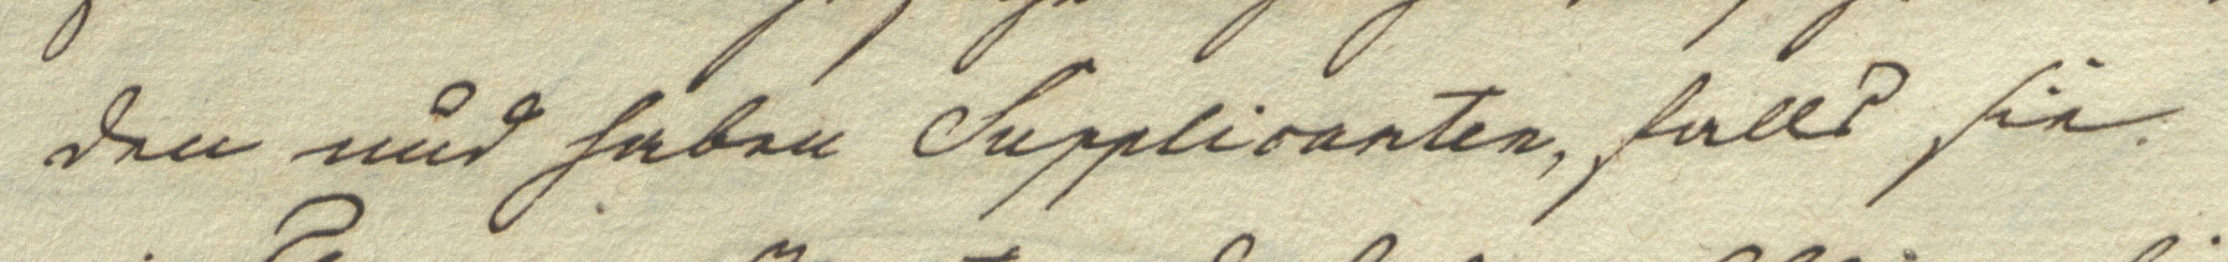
den und haben Supplicanten, falls sie
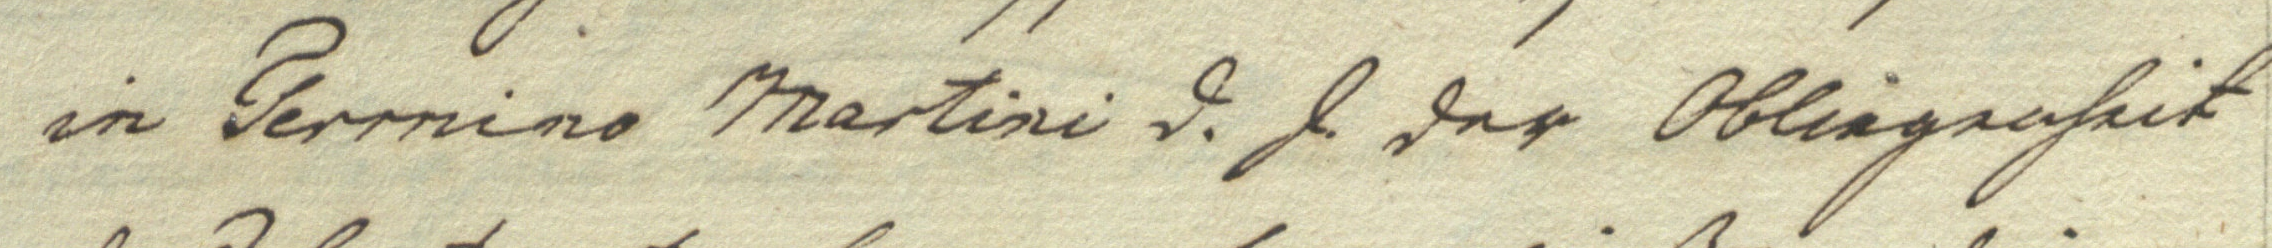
in Termino Martini d. J. der Obliegenheit
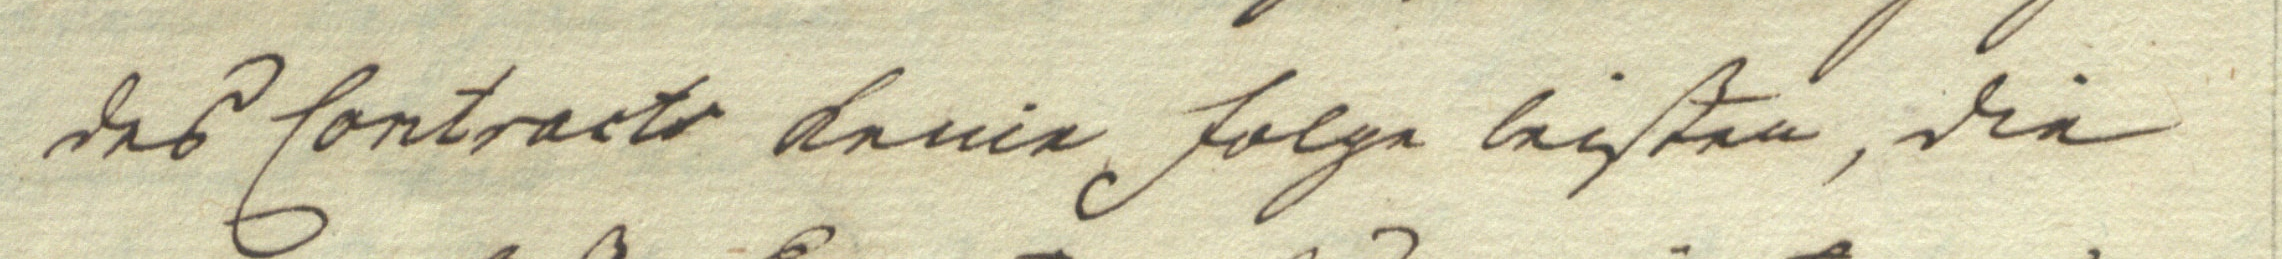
des Contracts keine Folge leisten, die
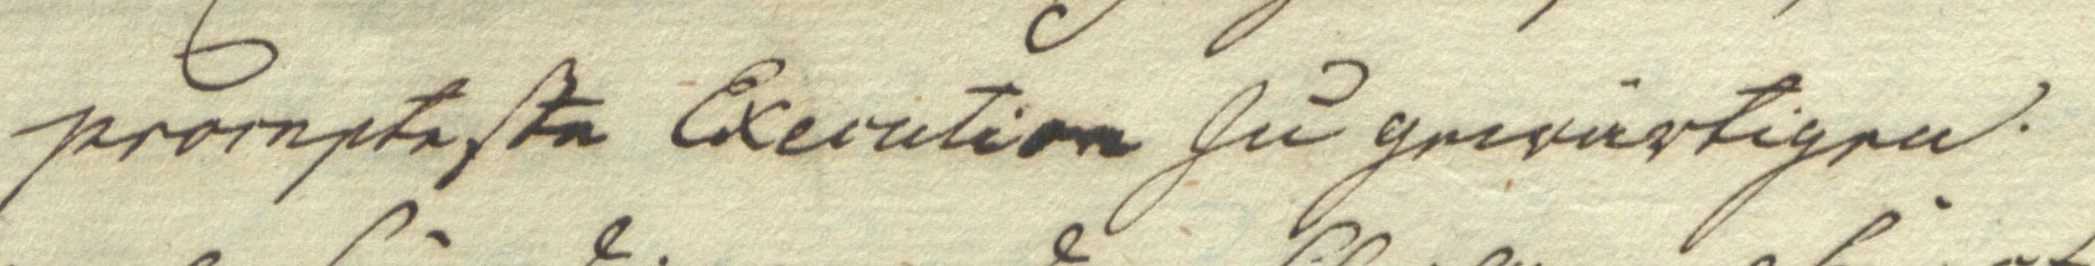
prompteste Execution zu gewärtigen.
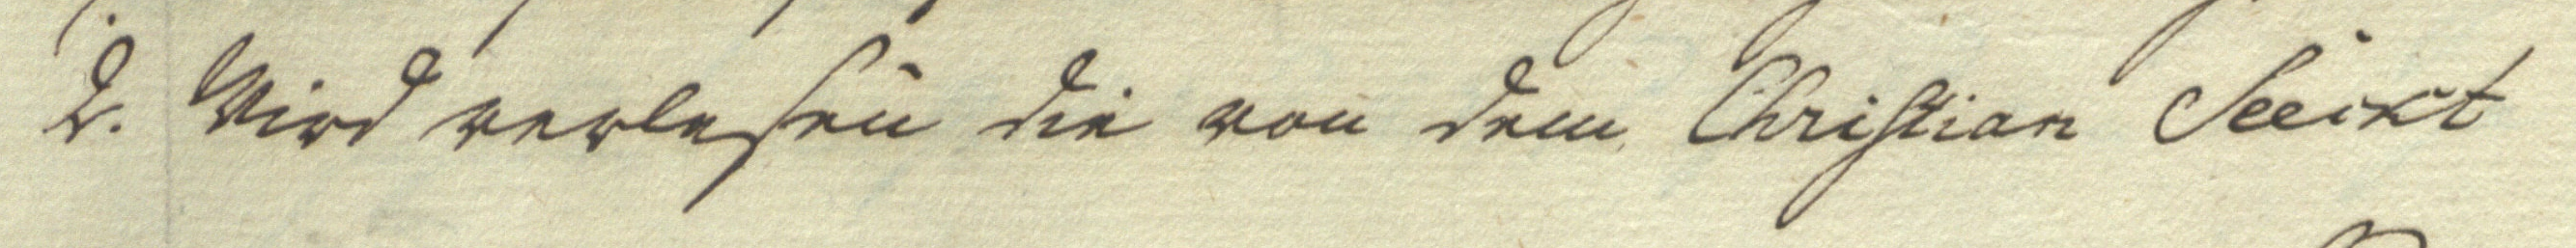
2. Wird verlesen die von dem Christian Seeckt
